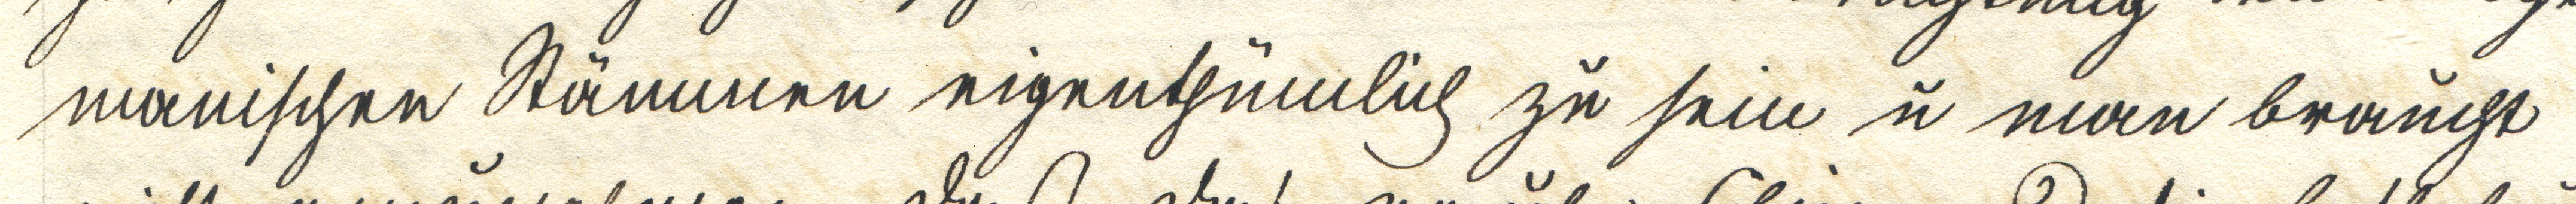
manischen Stämmen eigenthümlich zu sein u man braucht
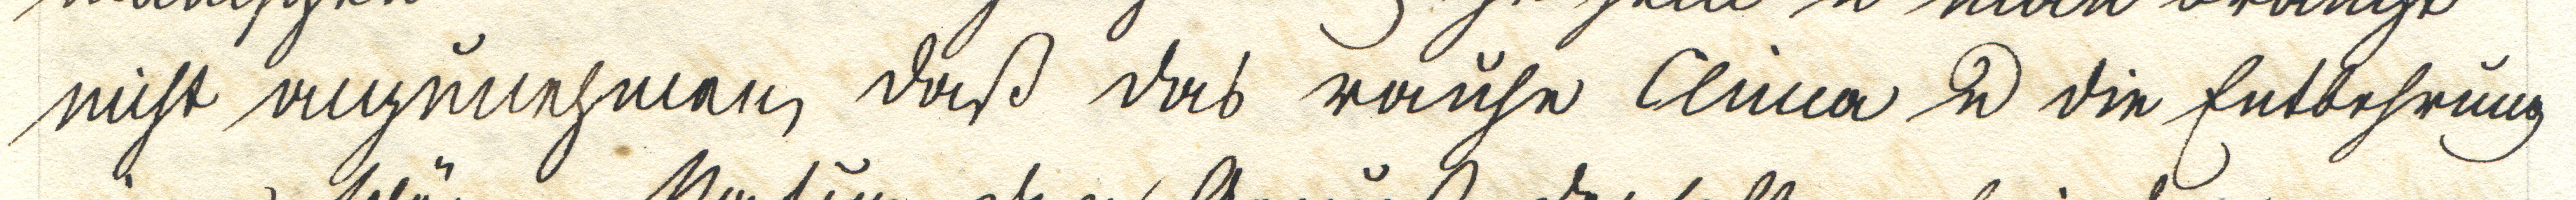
nicht anzunehmen, daß das rauhe Clima u die Entbehrung
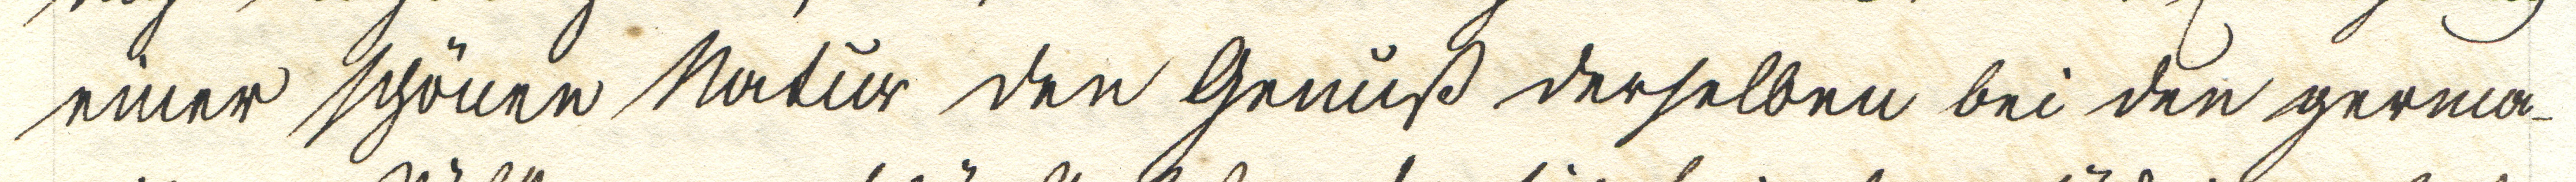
einer schönen Natur den Genuß derselben bei den germa-
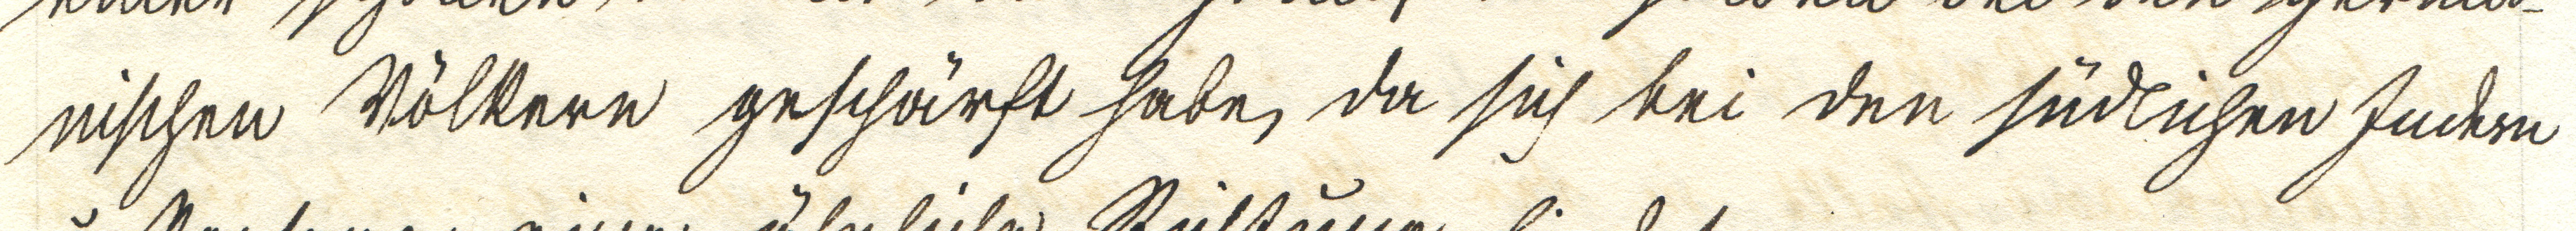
nischen Völkern geschärft habe, da sich bei den südlichen Indern
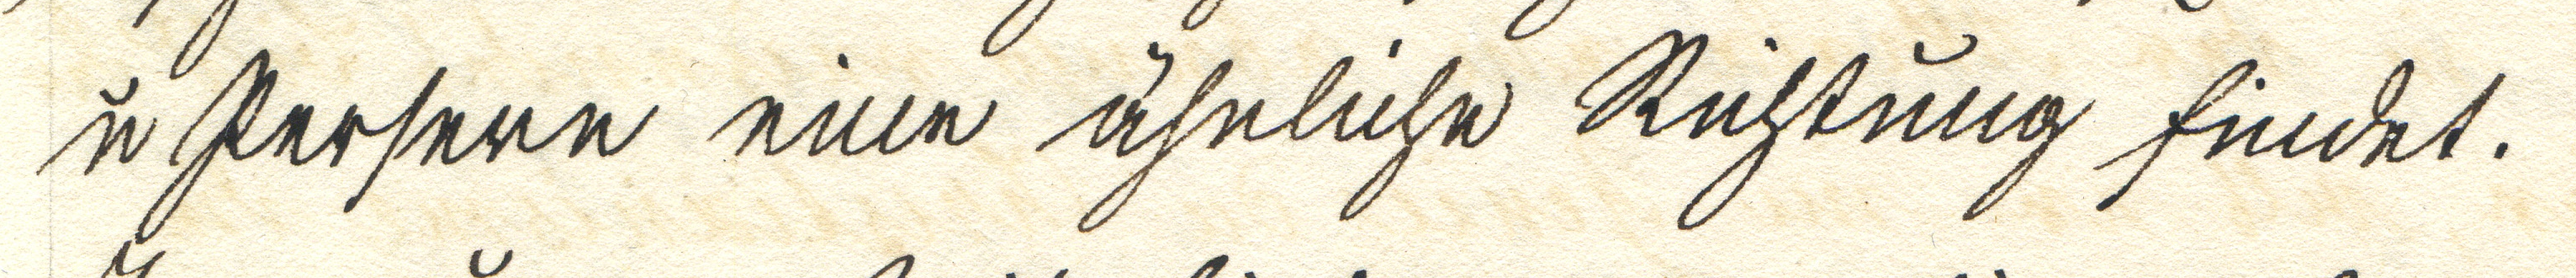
u Persern eine ähnliche Richtung findet.
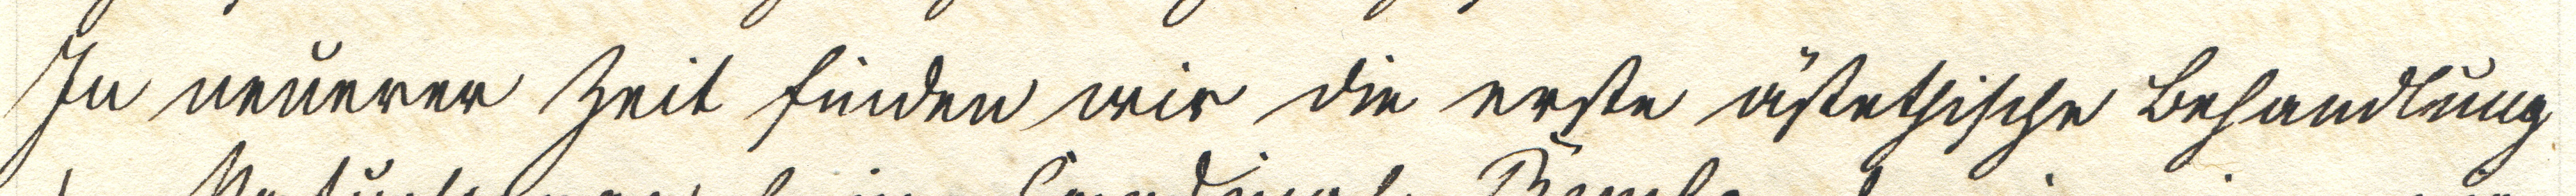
In neuerer Zeit finden wir die erste ästethische Behandlung
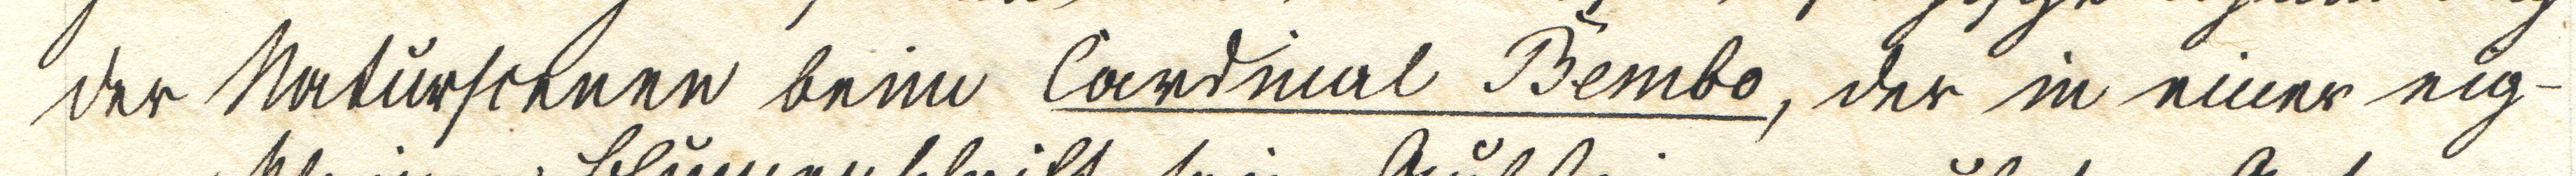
der Naturscenen beim Cardinal Bembo, der in einer eig-
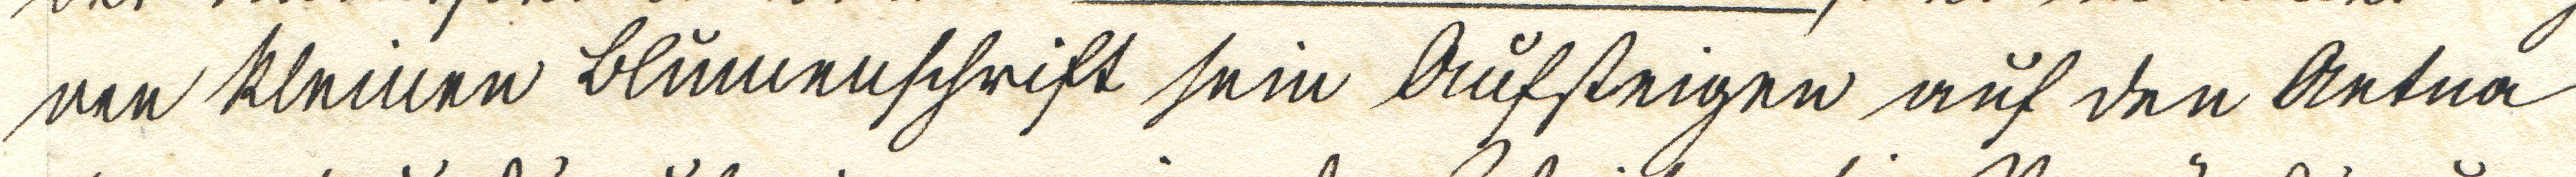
nen kleinen Blumenschrift sein Aufsteigen auf den Aetna
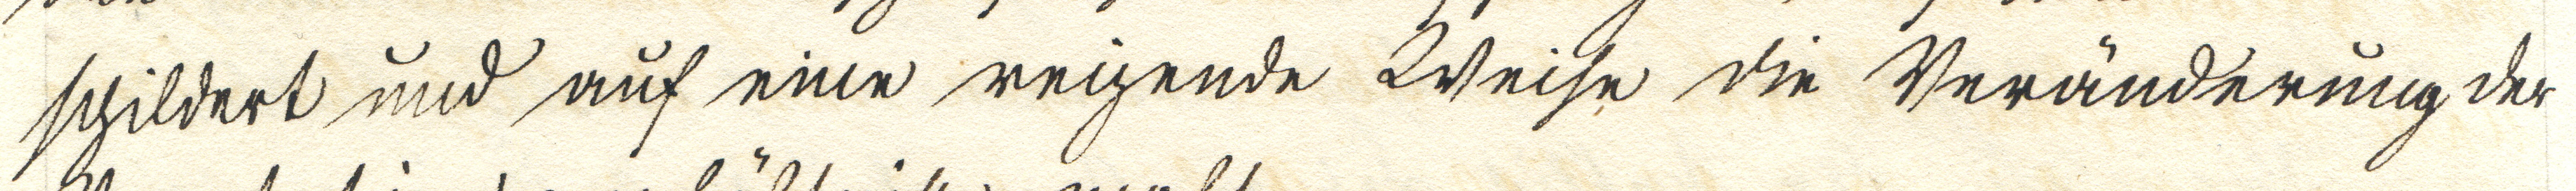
schildert und auf eine reizende Weise die Veränderung der
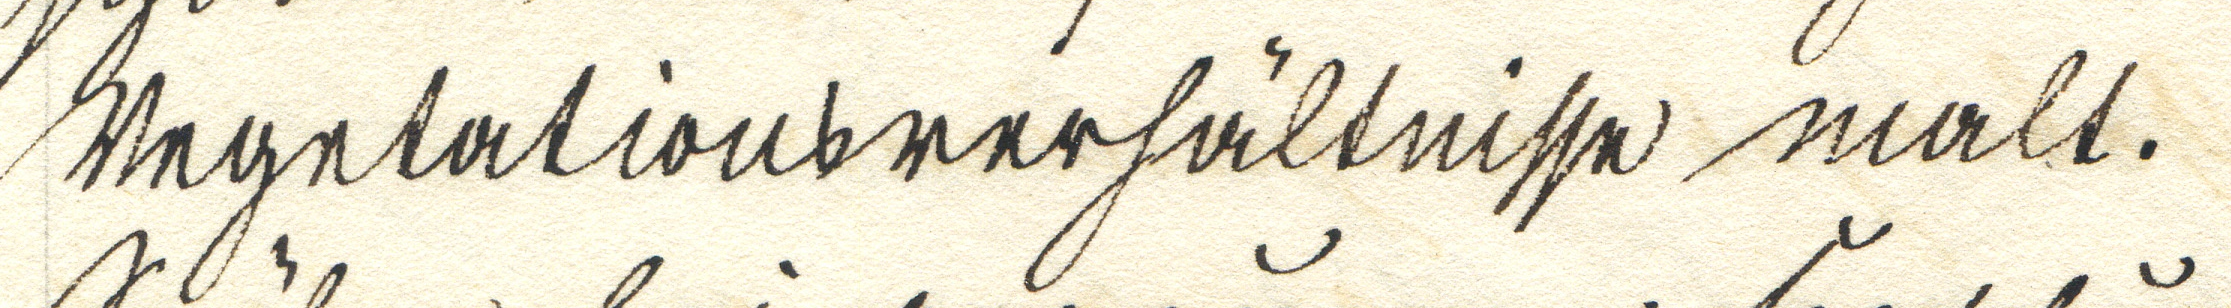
Vegetationsverhältnisse malt.
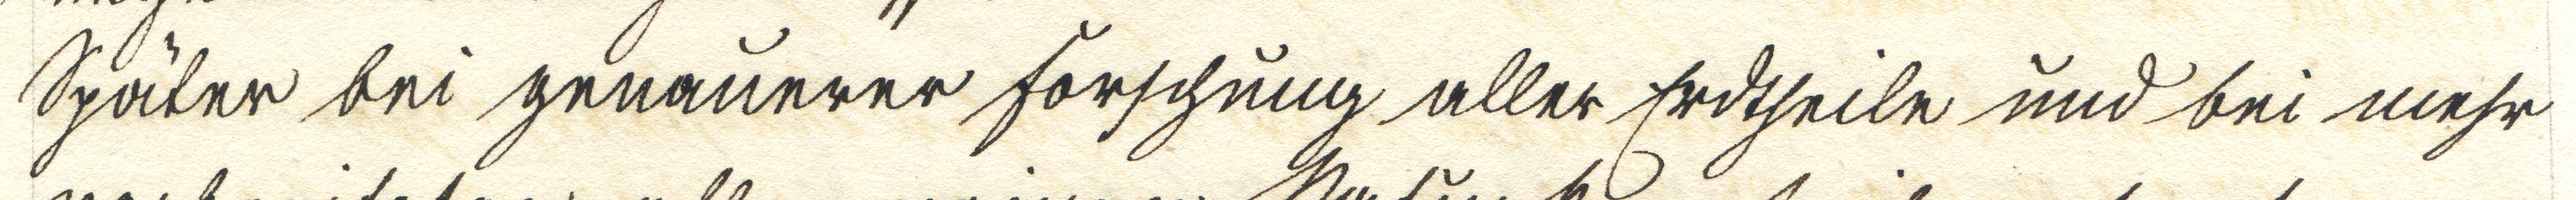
Später bei genauerer Erforschung aller Erdtheile und bei mehr
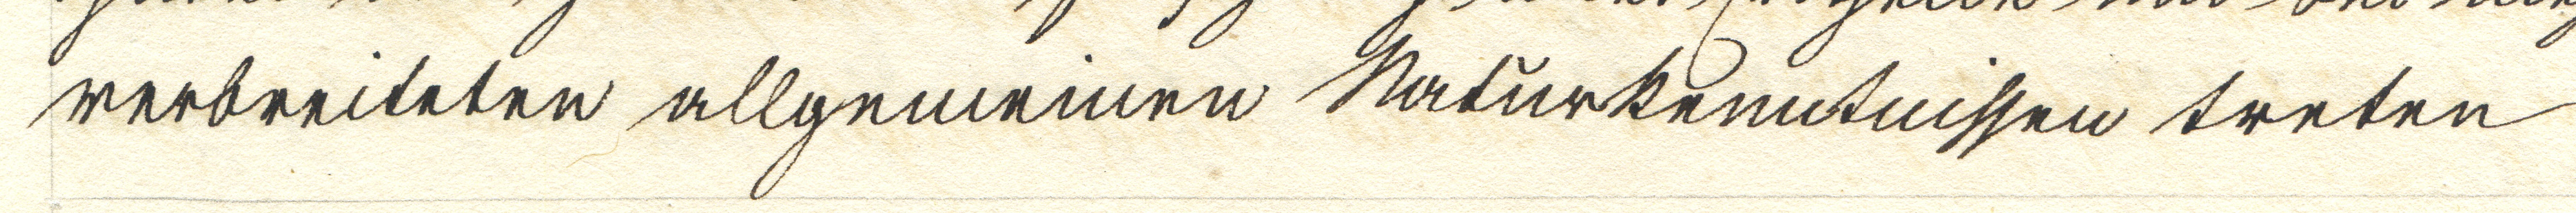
verbreiteten allgemeinen Naturkenntnissen treten
